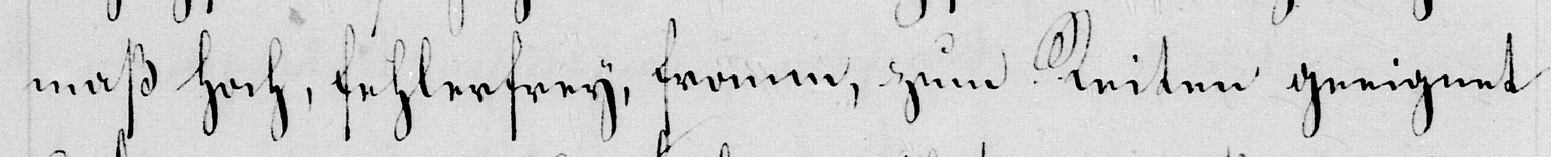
maß hoch, fehlerfrey, fromm, zum Reiten geeignet
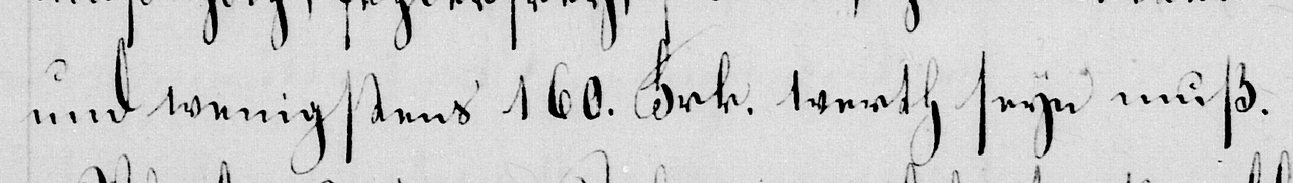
und wenigstens 160 Frk. werth seyn muß.
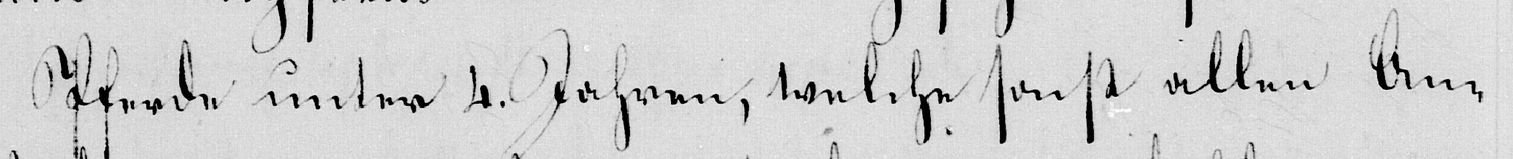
Pferde unter 4. Jahren, welche sonst allen An¬
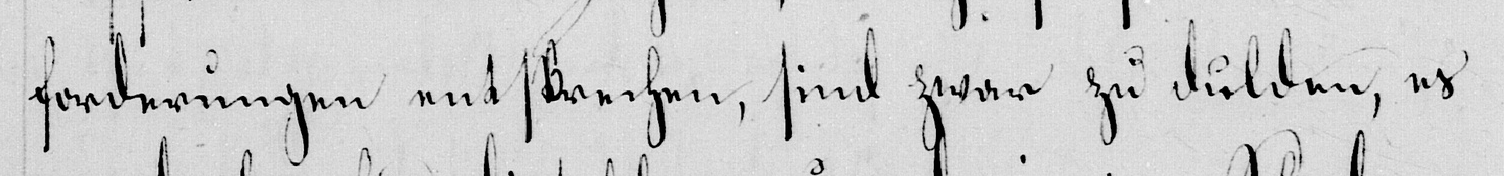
forderungen entsprechen, sind zwar zu dulden, es
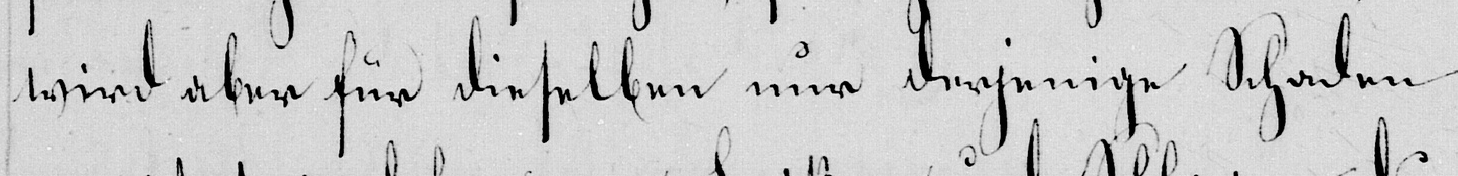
wird aber für dieselben nur derjenige Schaden
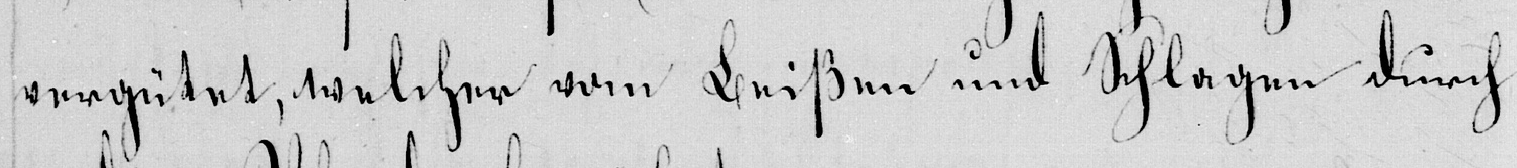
vergütet, welcher vom Beißen und Schlagen durch
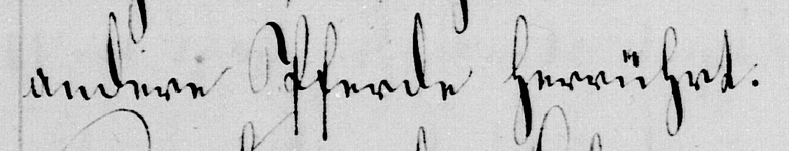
andere Pferde herrührt.
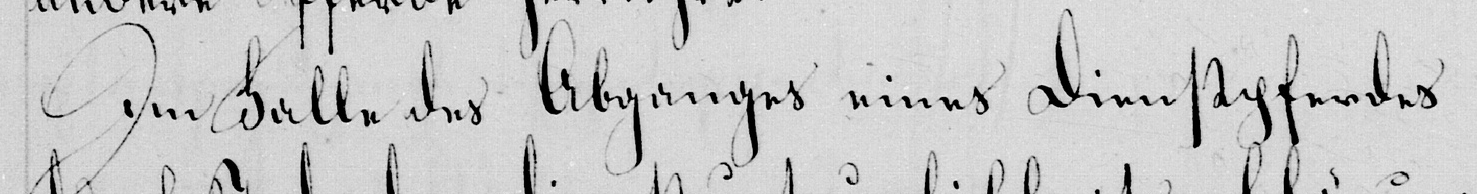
Im Falle des Abganges eines Dienstpferdes
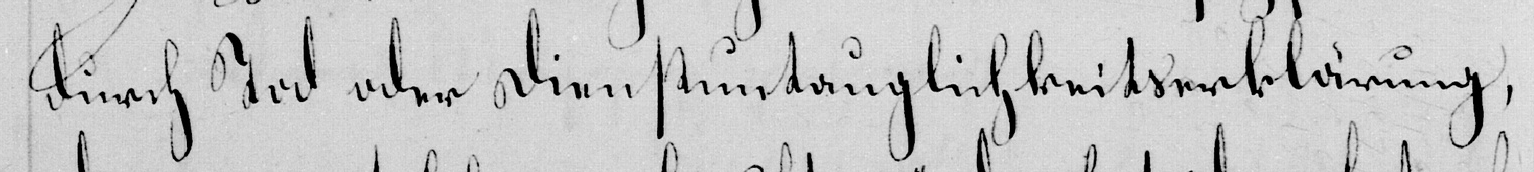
durch Tod oder Dienstuntauglichkeitserklärung,
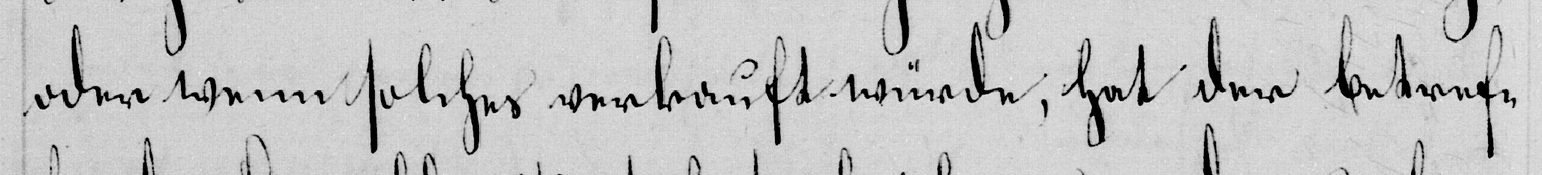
oder wenn solches verkauft würde, hat der betref¬
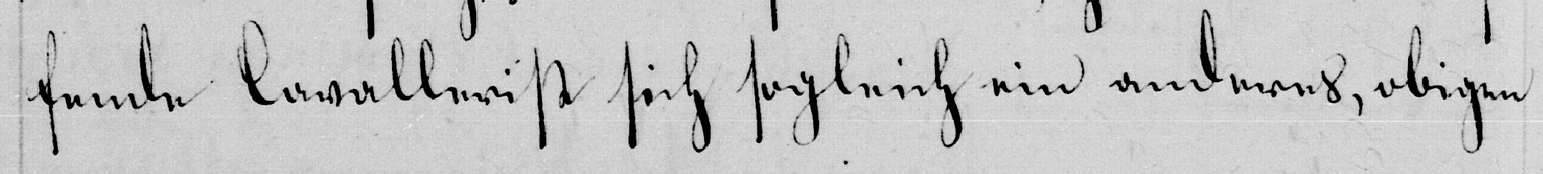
fende Cavallerist sich sogleich ein anderes, obigen
